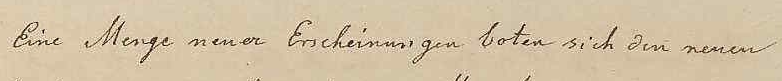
Eine Menge neuer Erscheinungen boten sich den neuen
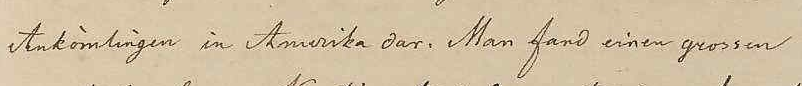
Ankömlingen in Amerika dar. Man fand einen grossen
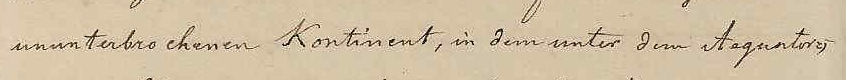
ununterbrochenen Kontinent, in dem unter dem Aequatore,
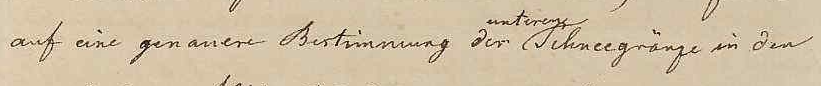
auf eine genauere Bestimmung der unteren Schneegränze in den
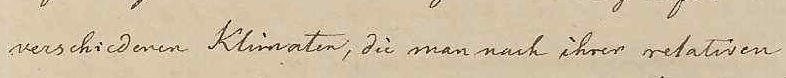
verschiedenen Klimaten, die man nach ihrer relativen
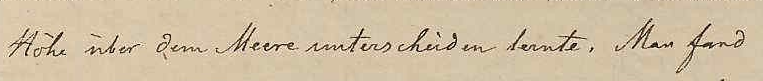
Höhe über dem Meere unterscheiden lernte. Man fand
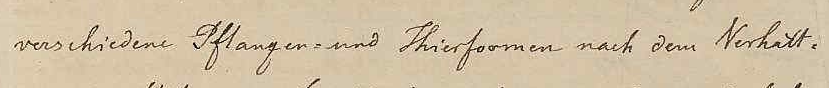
verschieden Pflanzen- und Thierformen nach dem Verhält-
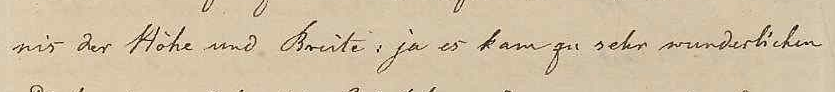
nis der Höhe und Breite: ja es kam zu sehr wunderlichen
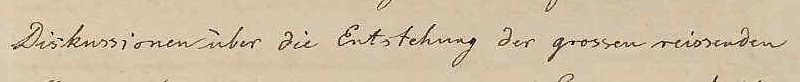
Diskussionen über die Entstehung der grossen reissenden
